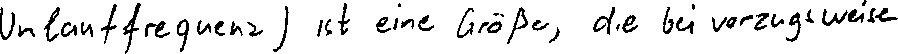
Umlauffrequenz) ist eine Größe, die bei vorzugsweise
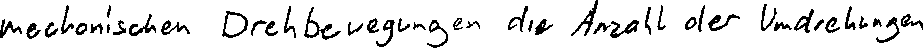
mechanischen Drehbewegungen die Anzahl der Umdrehungen
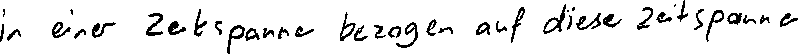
in einer Zeitspanne bezogen auf diese Zeitspanne
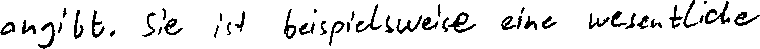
angibt. Sie ist beispielsweise eine wesentliche
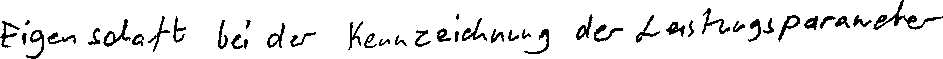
Eigenschaft bei der Kennzeichnung der Leistungsparameter
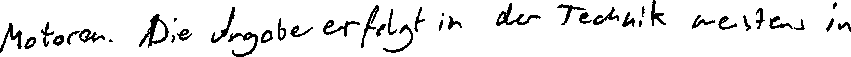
Motoren. Die Angabe erfolgt in der Technik meistens in
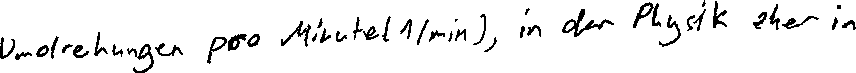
Umdrehungen pro Minute (1/min), in der Physik eher in
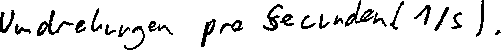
Umdrehungen pro Sekunde (1/s).
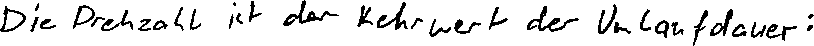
Die Drehzahl ist der Kehrwert der Umlaufdauer:
